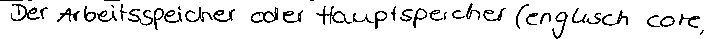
Der Arbeitsspeicher oder Hauptspeicher (englisch core,
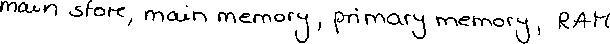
main store, main memory, primary memory, RAM
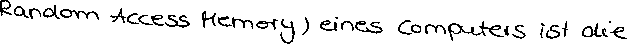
Random Access Memory) eines Computers ist die
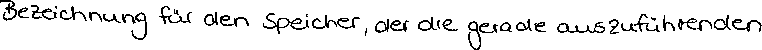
Bezeichnung für den Speicher, der die gerade auszuführenden
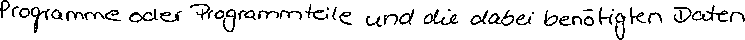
Programme oder Programmteile und die dabei benötigten Daten
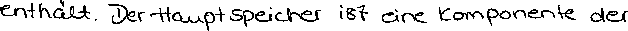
enthält. Der Hauptspeicher ist eine Komponente der
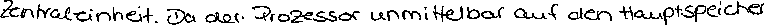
Zentraleinheit. Da der Prozessor unmittelbar auf den Hauptspeicher
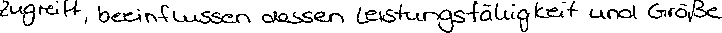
zugreift, beeinflussen dessen Leistungsfähigkeit und Größe
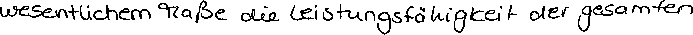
wesentlichem Maße die Leistungsfähigkeit der gesamten
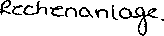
Rechenanlage.
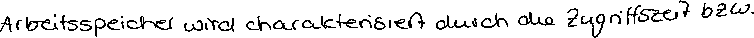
Arbeitsspeicher wird charakterisiert durch die Zugriffszeit bzw.
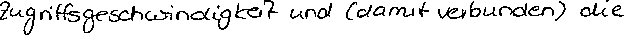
Zugriffsgeschwindigkeit und (damit verbunden) die
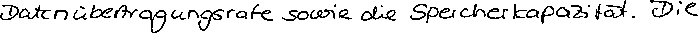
Datenübertragungsrate sowie die Speicherkapazität. Die
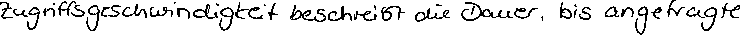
Zugriffsgeschwindigkeit beschreibt die Dauer, bis angefragte
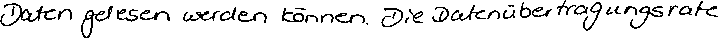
Daten gelesen werden können. Die Datenübertragungsrate
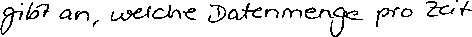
gibt an, welche Datenmenge pro Zeit
